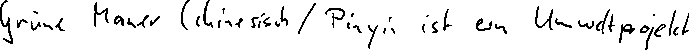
Grüne Mauer (chinesisch / Pinyin ist ein Umweltprojekt
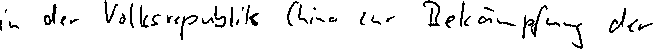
in der Volksrepublik China zur Bekämpfung der
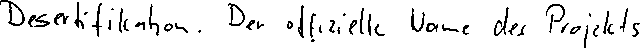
Desertifikation. Der offizielle Name des Projekts
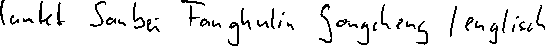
lautet Sanbei Fanghulin Gongcheng / englisch
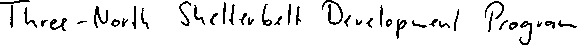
Three-North Shelterbelt Development Program
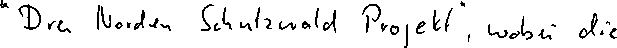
"Drei-Norden-Schutzwald-Projekt", wobei die
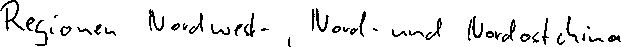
Regionen Nordwest-, Nord- und Nordostchina
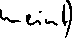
meint).
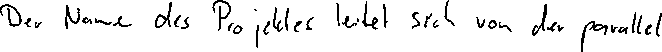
Der Name des Projektes leitet sich von der parallel
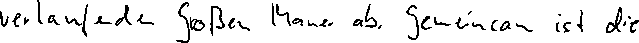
verlaufenden Großen Mauer ab. Gemeinsam ist die
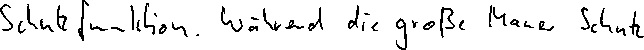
Schutzfunktion: Während die große Mauer Schutz
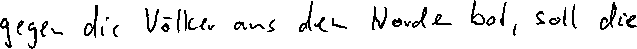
gegen die Völker aus dem Norden bot, soll die
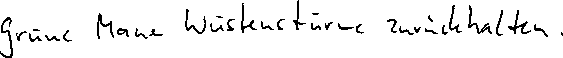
Grüne Mauer Wüstenstürme zurückhalten.
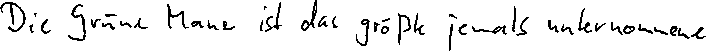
Die Grüne Mauer ist das größte jemals unternommene
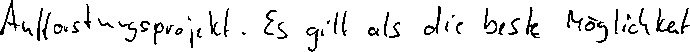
Aufforstungsprojekt. Es gilt als die beste Möglichkeit
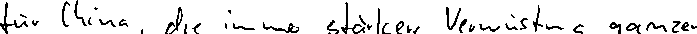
für China, die immer stärkere Verwüstung ganzer
